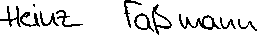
Heinz Faßmann
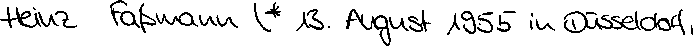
Heinz Faßmann (* 13. August 1955 in Düsseldorf
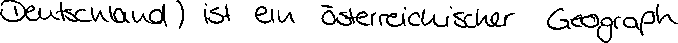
Deutschland) ist ein österreichischer Geograph
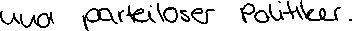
und parteiloser Politiker.
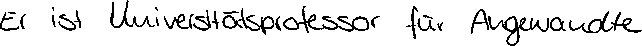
Er ist Universitätsprofessor für Angewandte
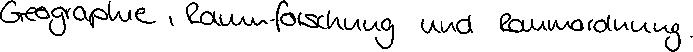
Geographie, Raumforschung und Raumordnung
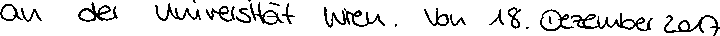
an der Universität Wien. Von 18. Dezember 2017
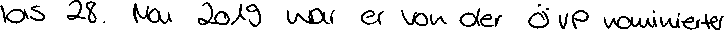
bis 28. Mai 2019 war er von der ÖVP nominierter
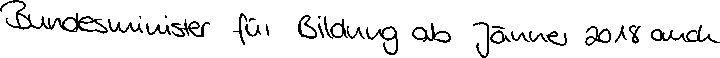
Bundesminister für Bildung ab Jänner 2018 auch
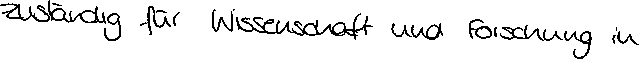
zuständig für Wissenschaft und Forschung in
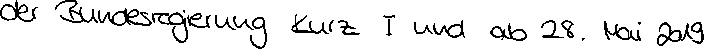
der Bundesregierung Kurz I und ab 28. Mai 2019
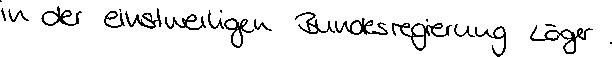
in der einstweiligen Bundesregierung Löger.
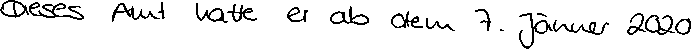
Dieses Amt hatte er ab dem 7. Jänner 2020
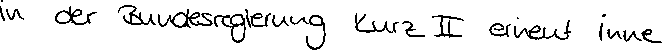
in der Bundesregierung Kurz II erneut inne
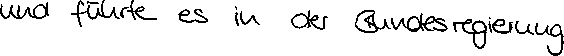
und führte es in der Bundesregierung
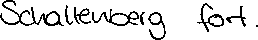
Schallenberg fort.
